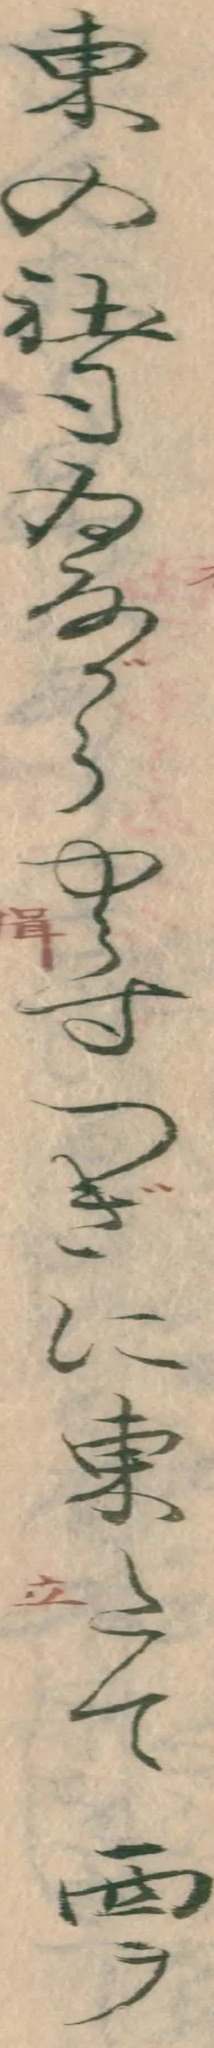東の社司ゐながらゆうすつぎに東たて西を
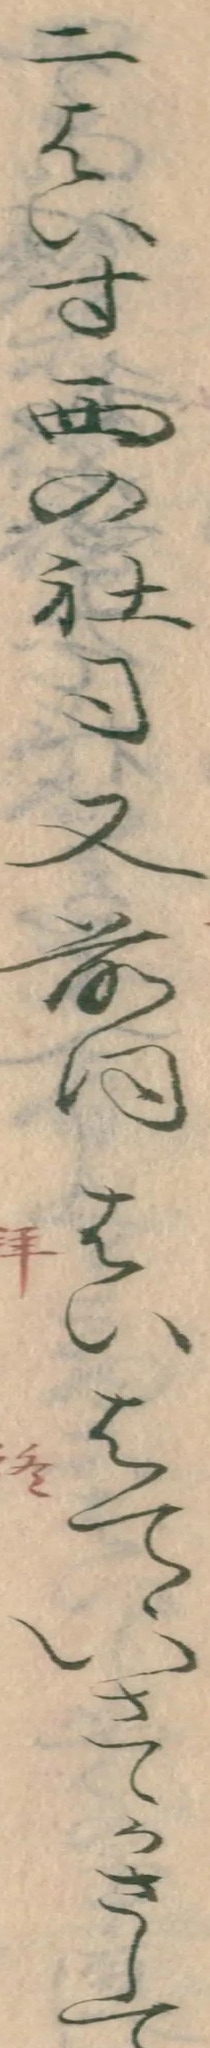二はいす西の社司又前同はいはてゝいさゝかさして
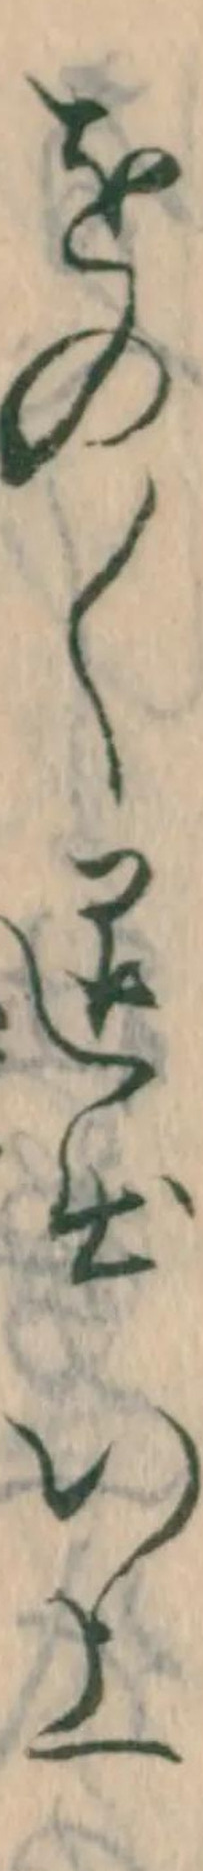をの〳〵退出い上
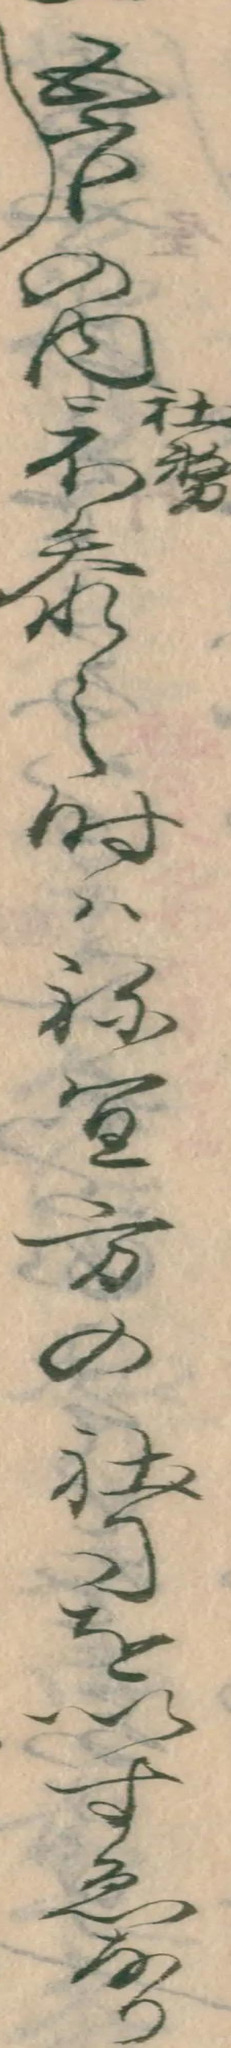一五官の内◦不参之時は祢宜方の社司を以すゑなり
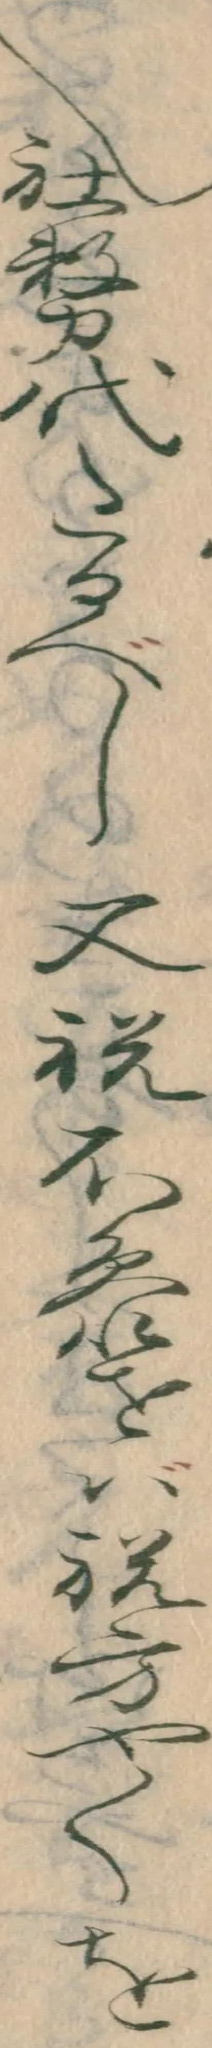社務代たるべし又祝不参をば祝方やくを
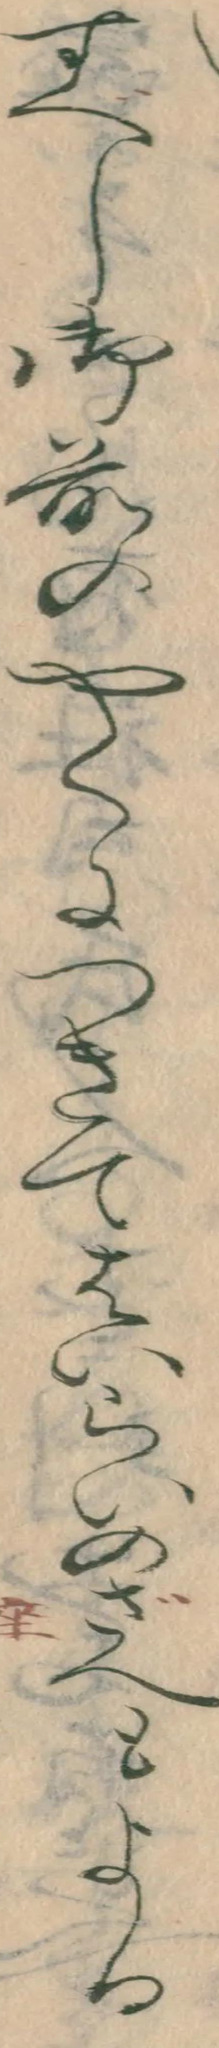すべし御前のやくにつきてはいらいのざへもよる
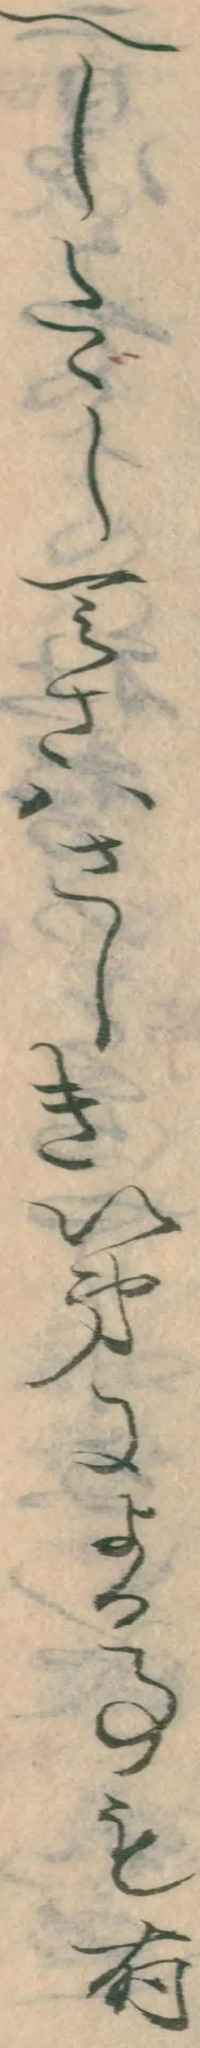へしたゞし天さはさしき次第による事も有
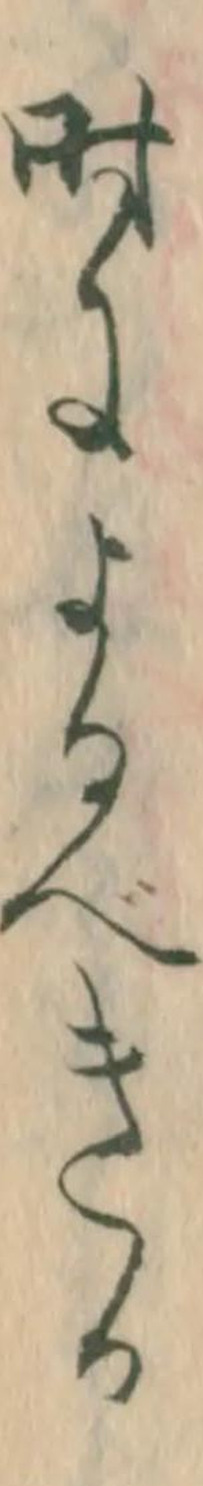時によるべきか

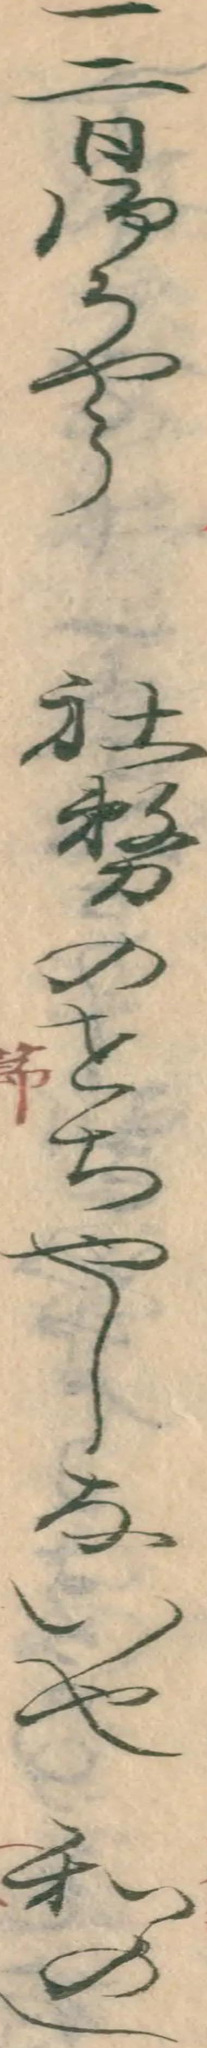一二日御ちやう社務のせちやしない也和の
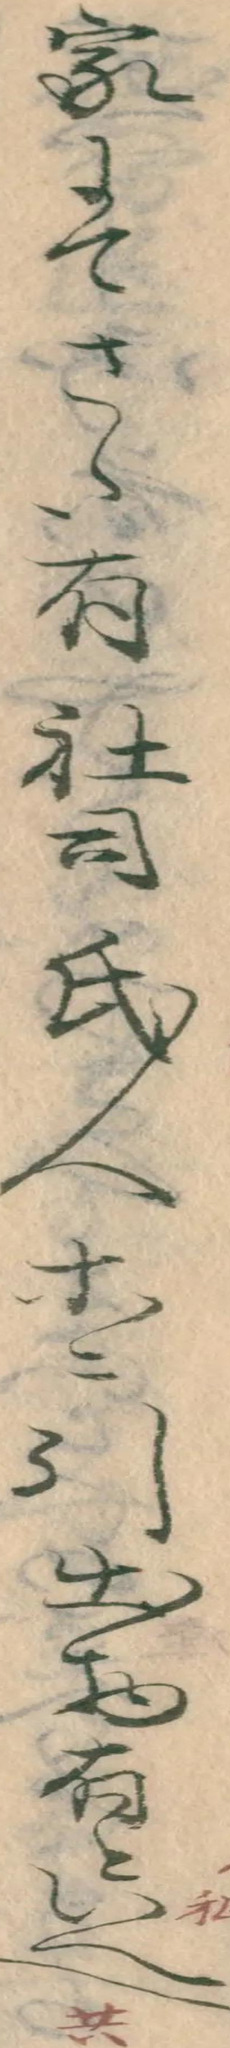家にてさた有社司氏人等に引出物有といへ共歟
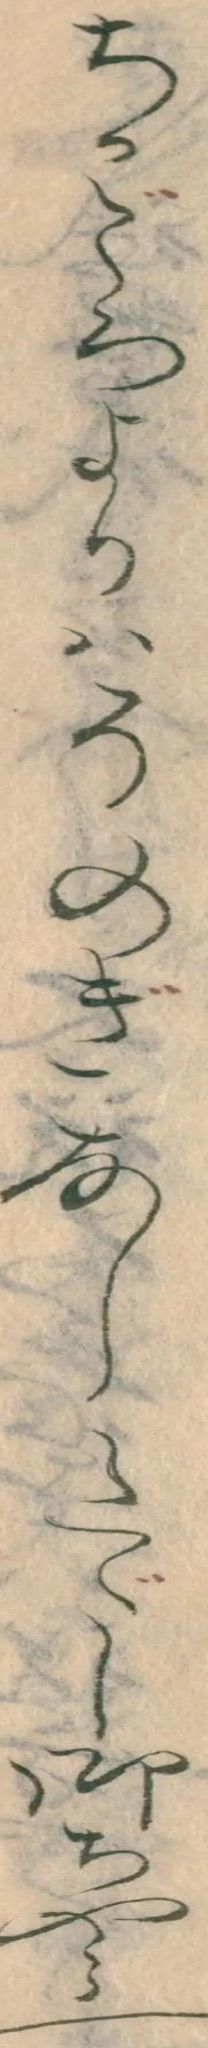ちかごろよりはそのぎなしたゞし御ちやう
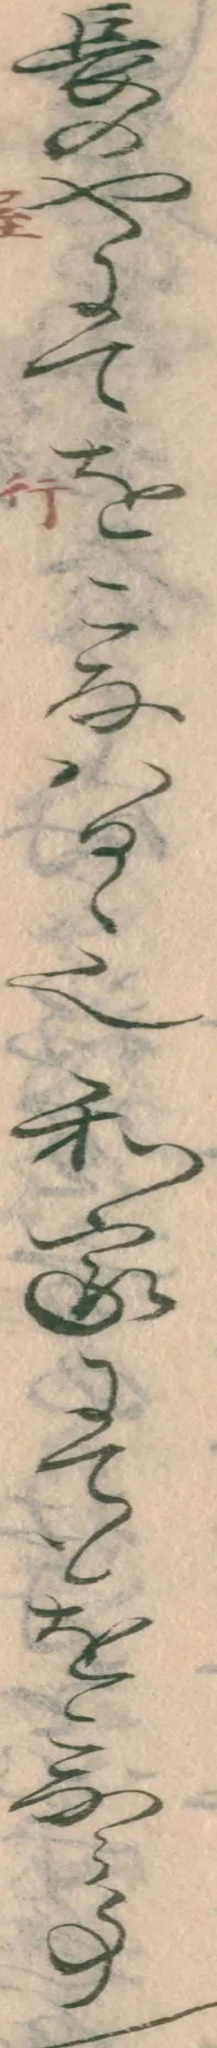長のやにてをこなはるゝ也和家にてもをこなう事
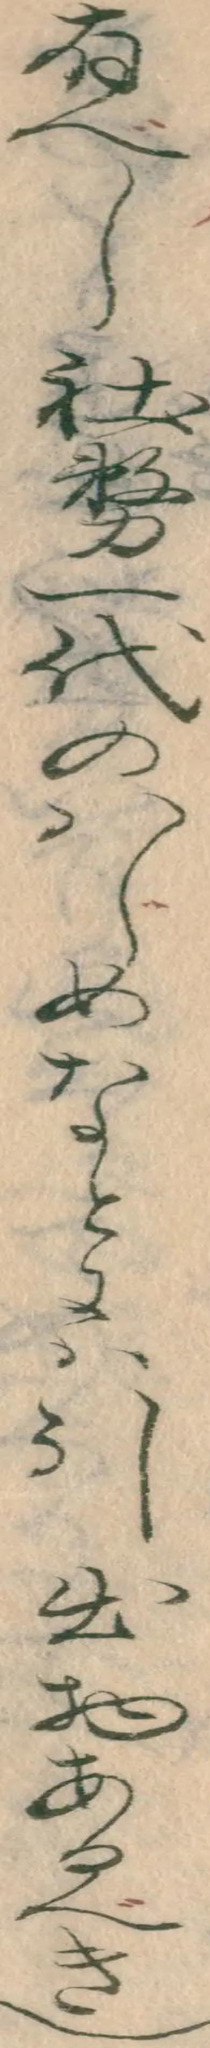有べし社務一代のはじめなとには引出物あるべき
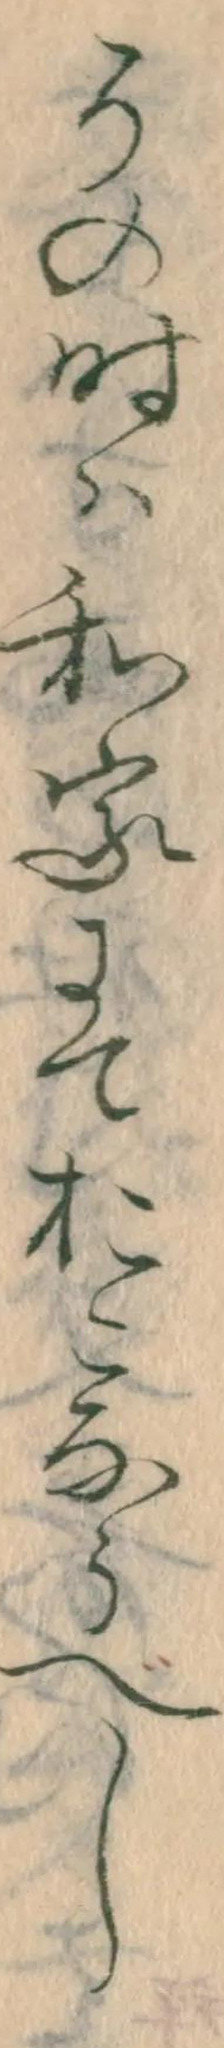その時は和家にておこなうべし
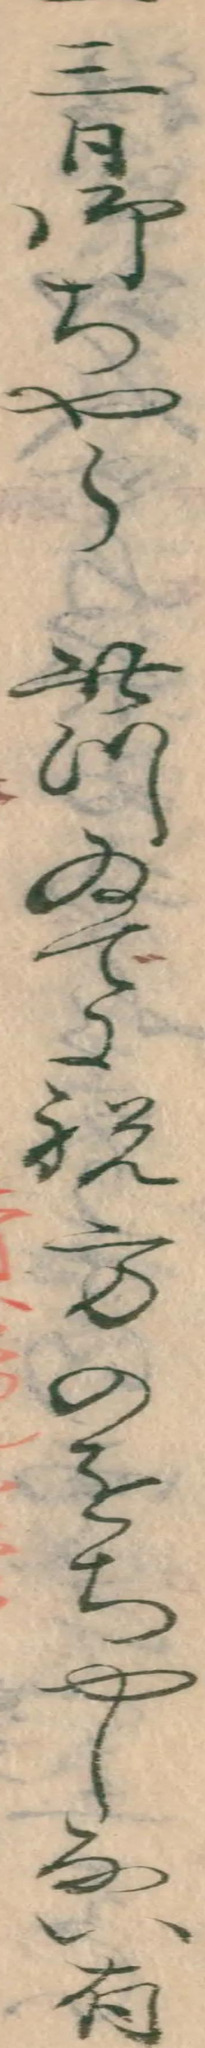一三日御ちやう此つゐでに祝方のせちやしない有
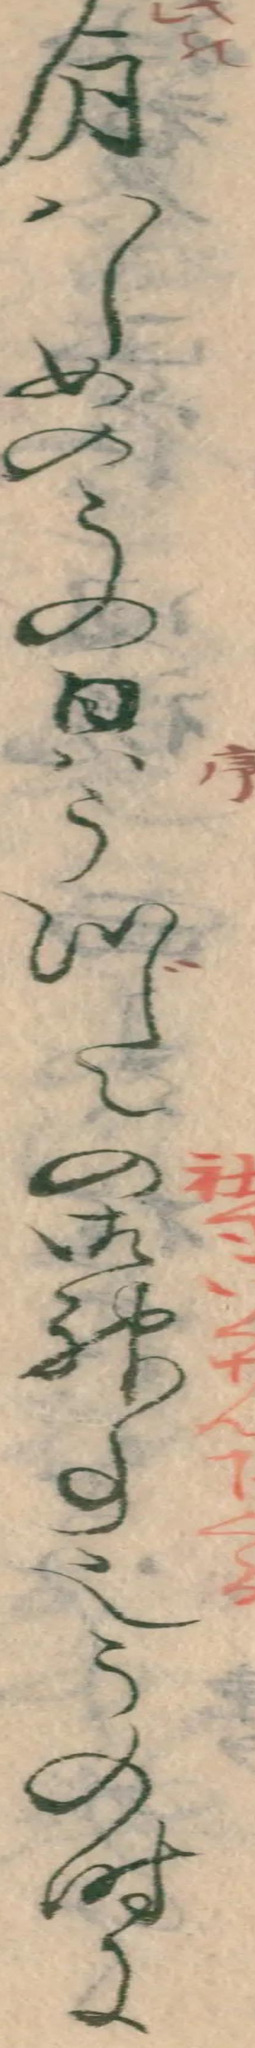月はしめのうの日はうづえの御神事也うの時に
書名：賀茂社記録. 第3冊
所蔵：国立国会図書館 National Diet Library, JAPAN
